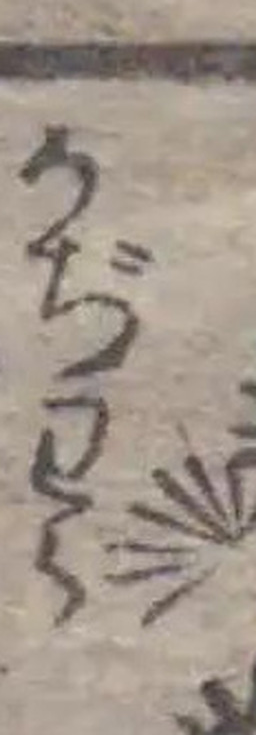かぢわら
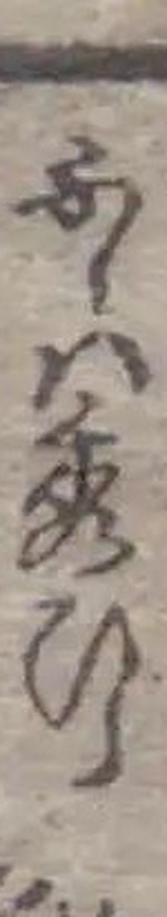ふしは秀ひら
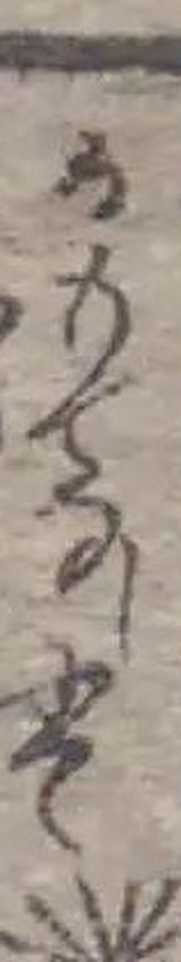かもてなしにて
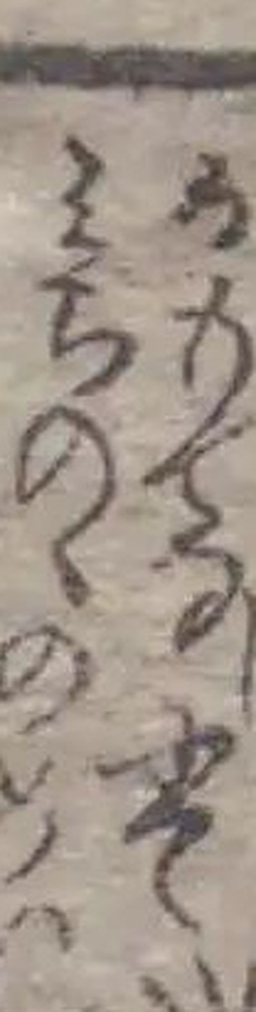みちのくのめい
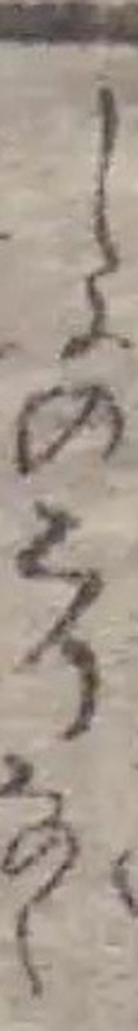しよのこりなく
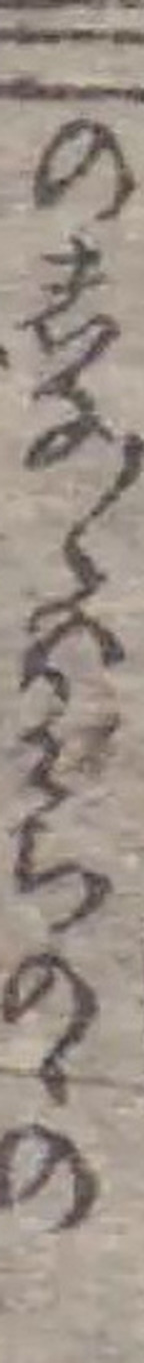のしな〳〵はみちのくの
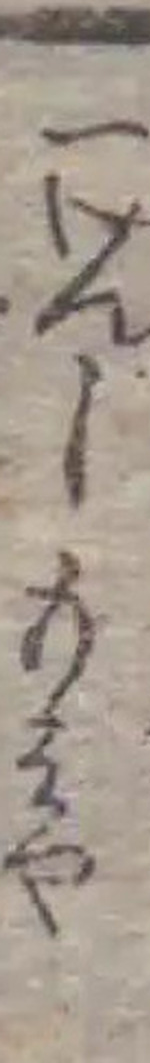一けんしもはや
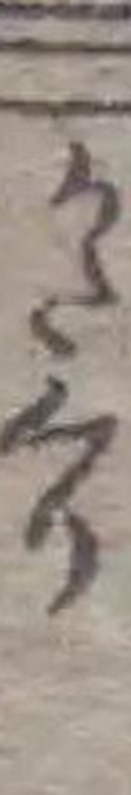かたくり
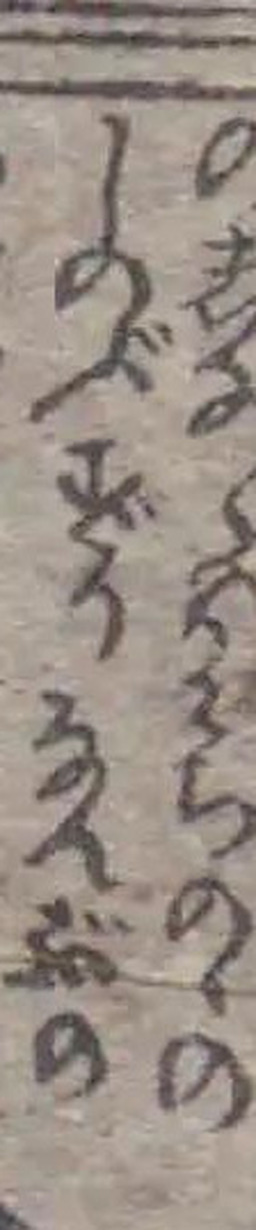しのぶずりなんぶの
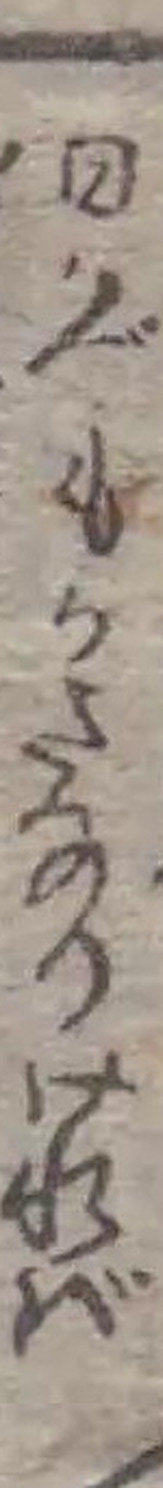日かもかさなりければ
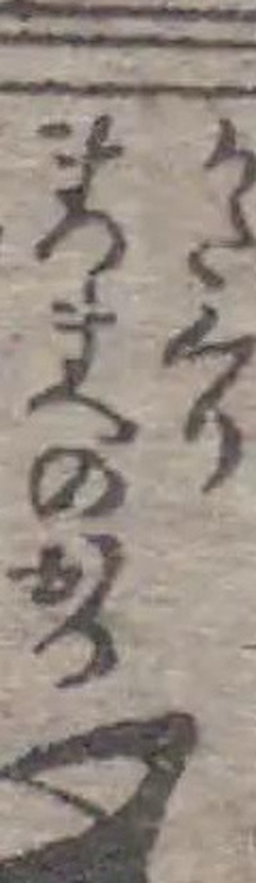まつまへのおつ
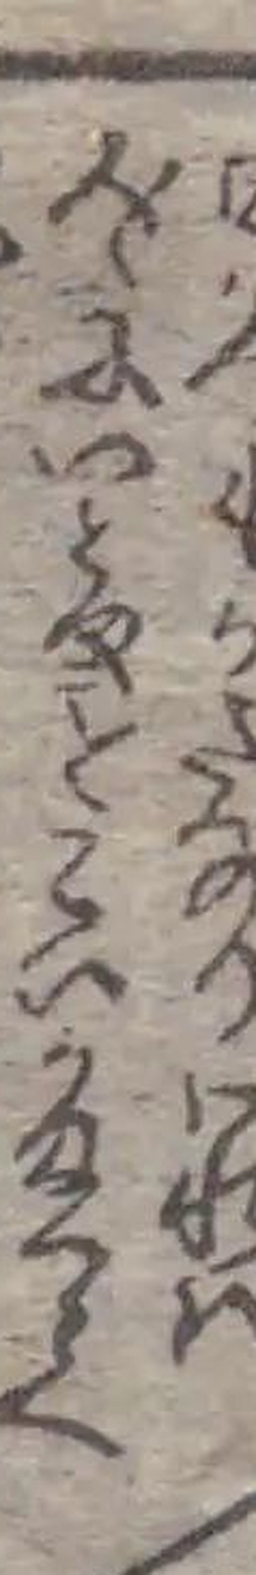人〳〵にいとまをこいかまくらへ
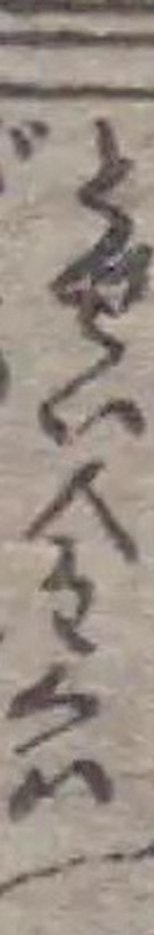とせい金くは
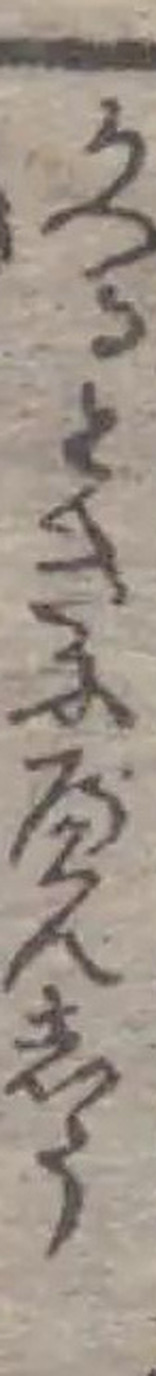かへるときにへんしう
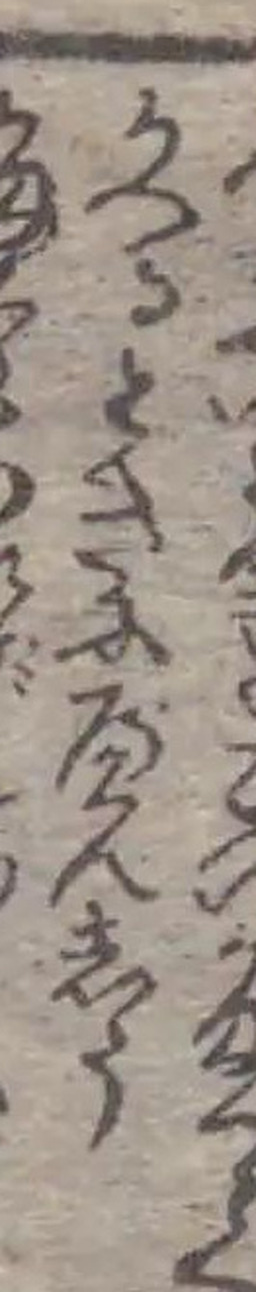かへるときにへんしう
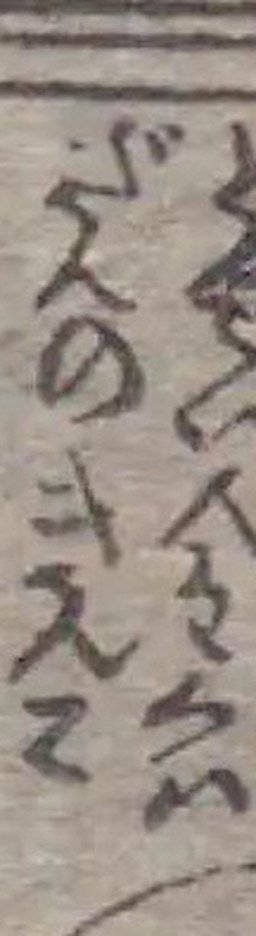ざんのきんこ
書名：通増安宅関 2巻
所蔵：国立国会図書館 National Diet Library, JAPAN
